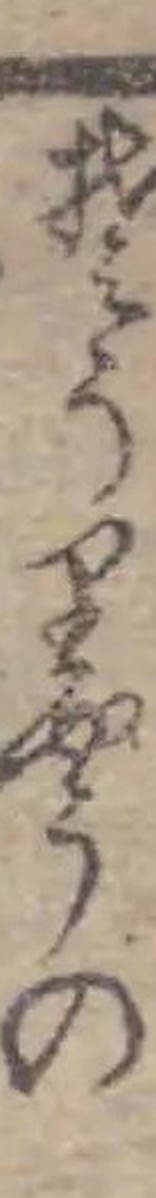そうりやうの
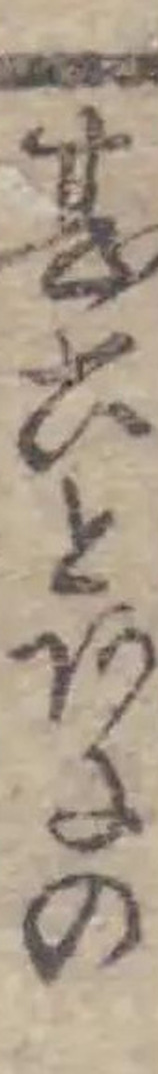甚六とあにの
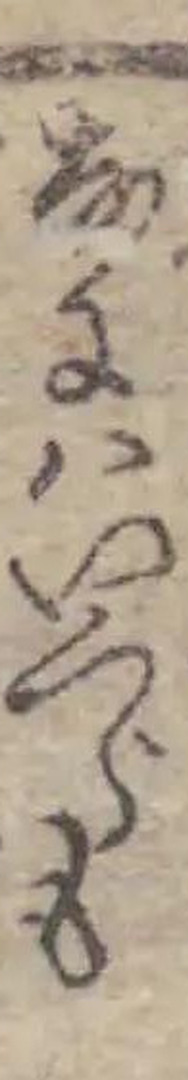なにはいくらも
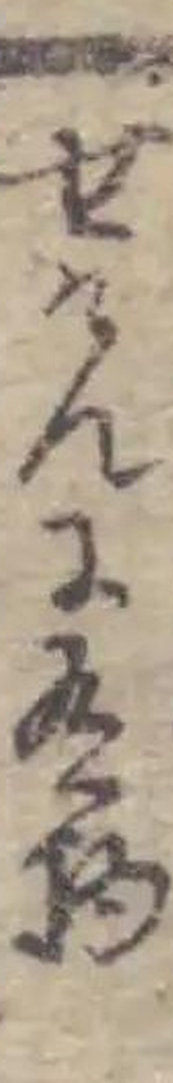せけんに有物
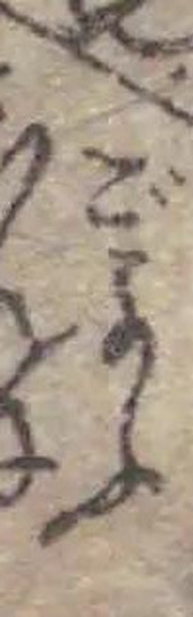ごよふ
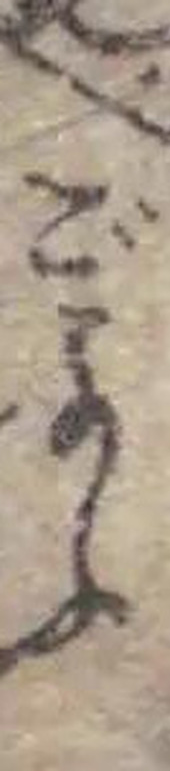ごよふ
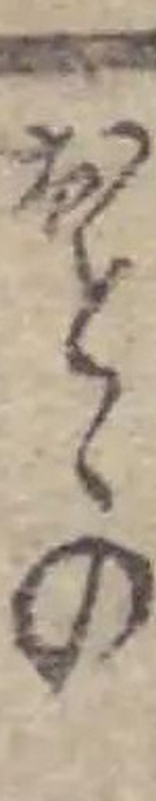おとゝの
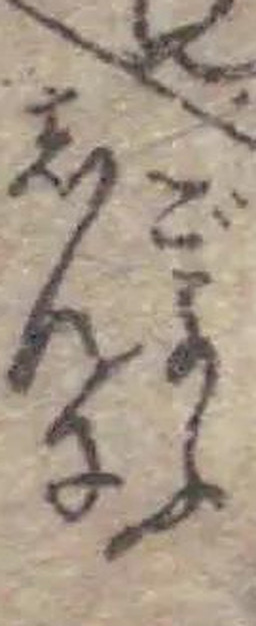しんに
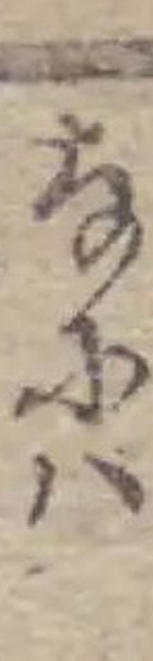なには
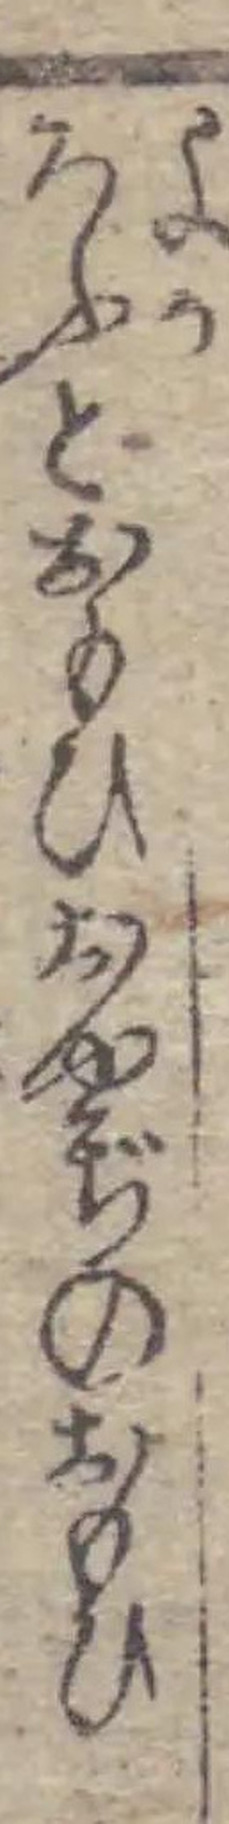ろふとおもひおやぢのおもひ
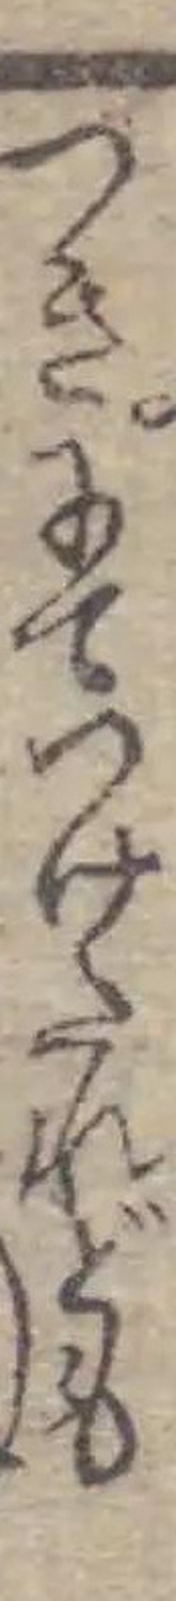つきにてつけたれども
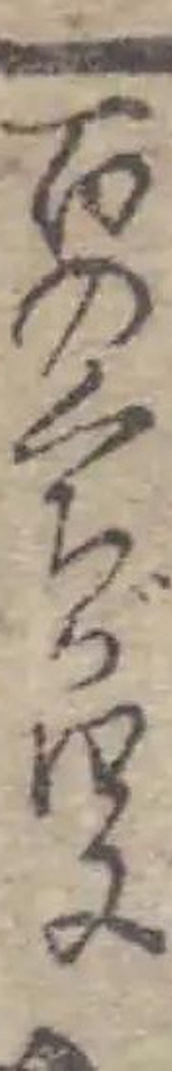百のくちが四文
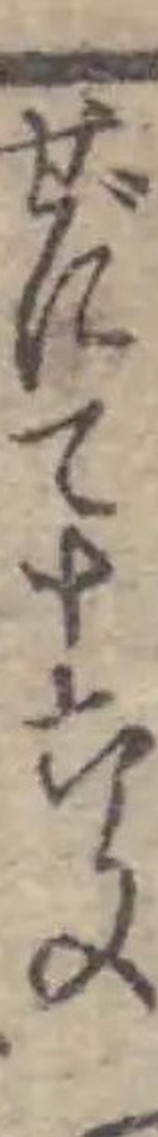ぜにて十六文
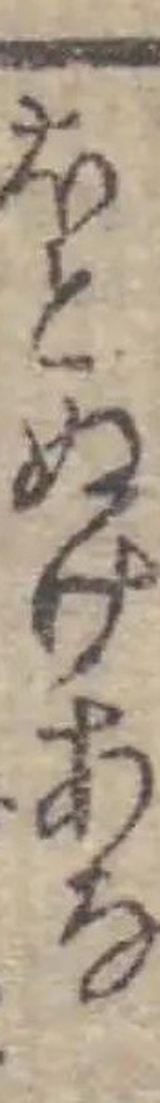ほとぬけあな
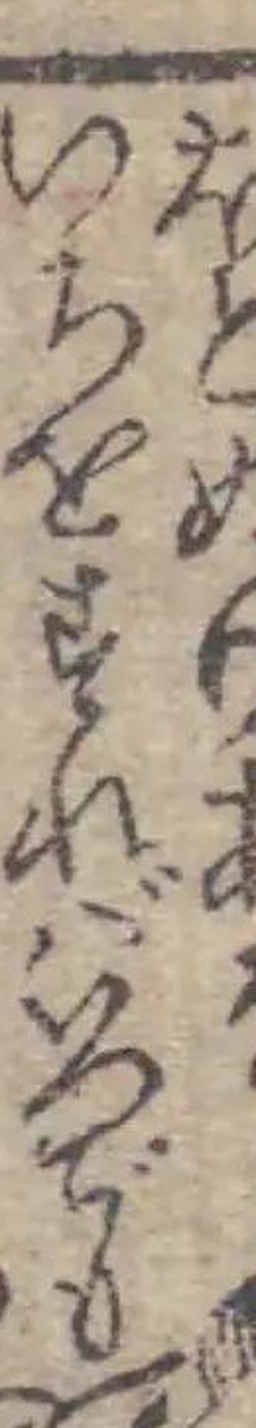いちをすればいつでも
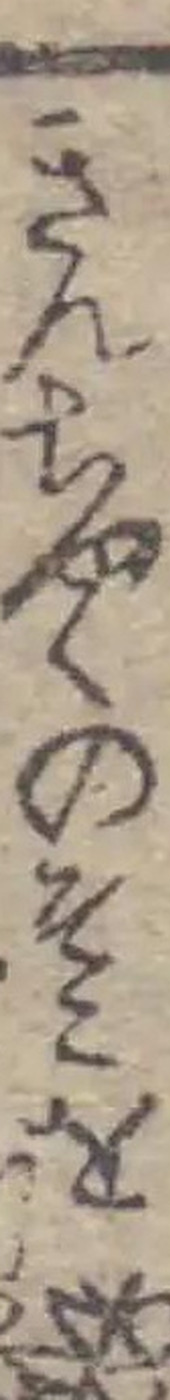きんちやくのそこを
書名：津以曽無弟の甚六 3巻
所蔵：国立国会図書館 National Diet Library, JAPAN
